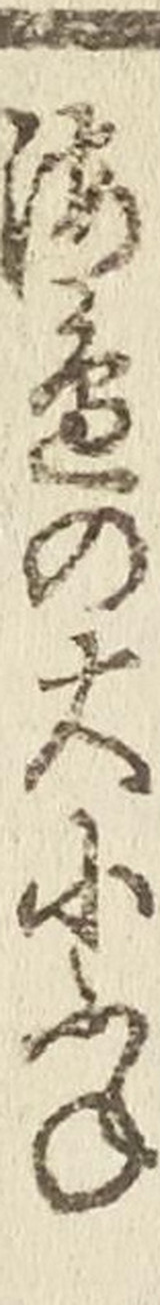海辺の大小ふね
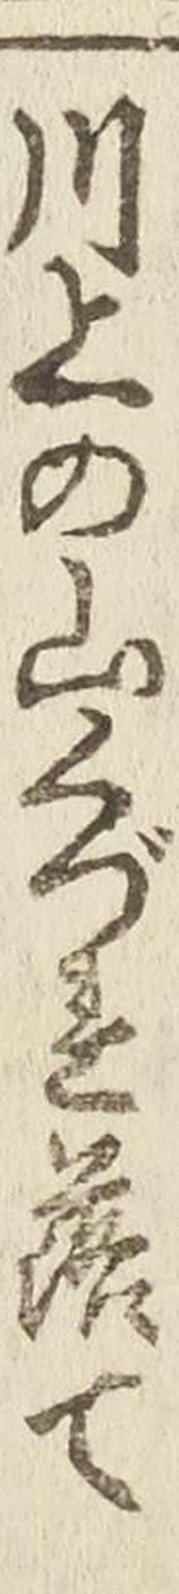川上の山くづれ落て
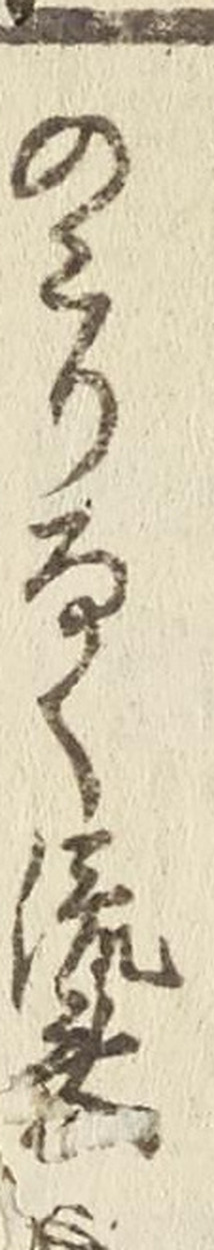のこりなく流失
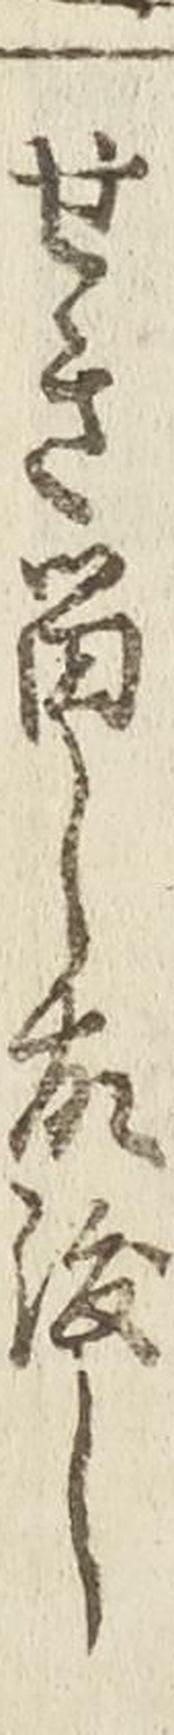せき留し故渡し
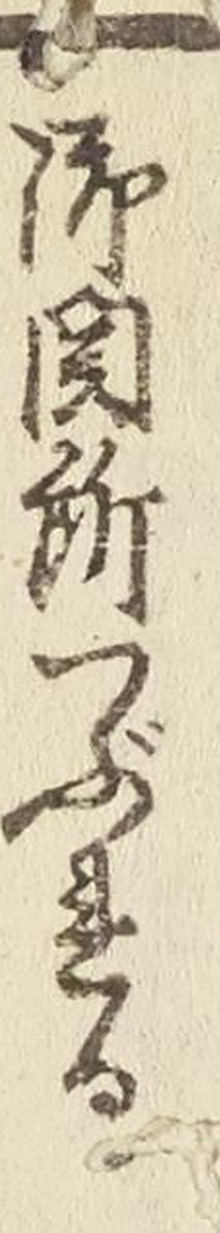御関所つぶれる
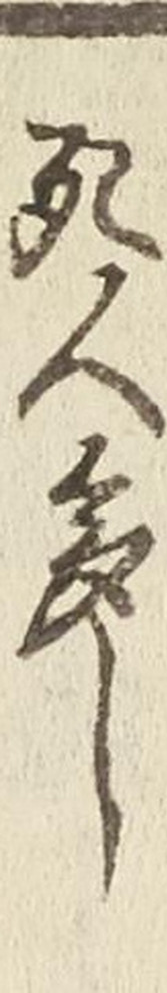死人多し
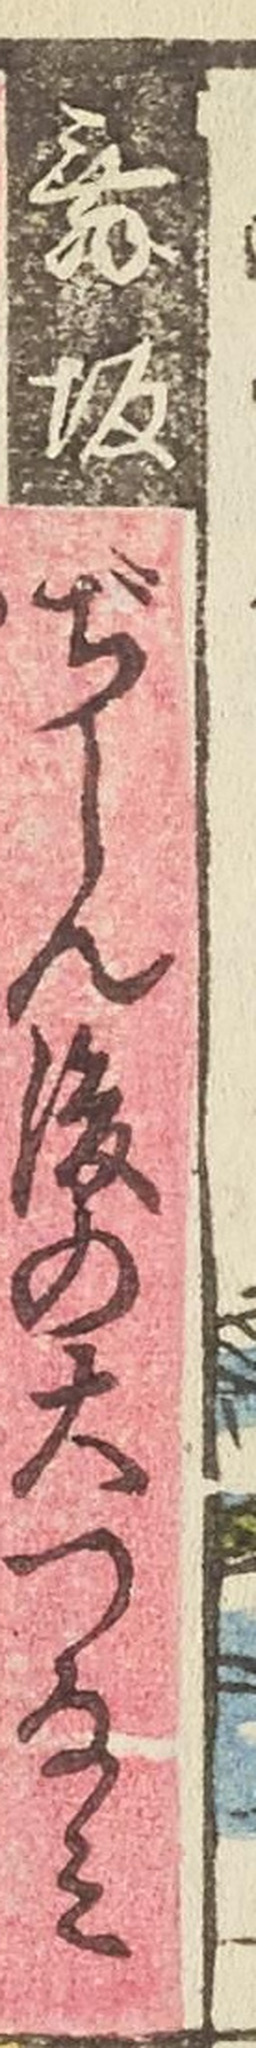舞坂ぢしん後の大つなみ
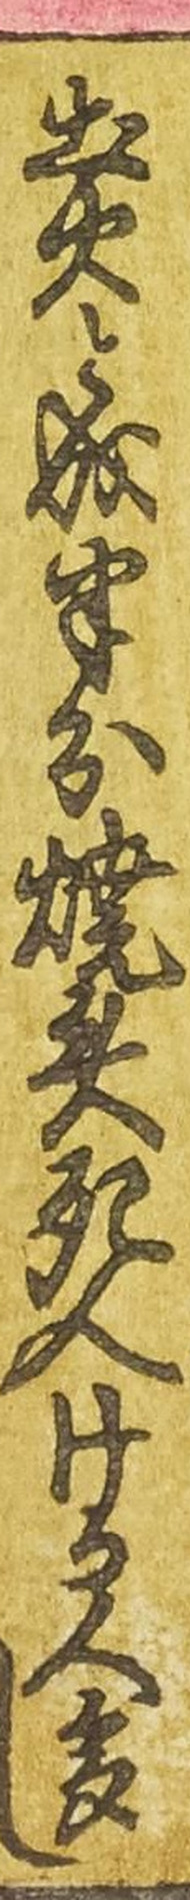出火と成半分焼失死人けか人多し
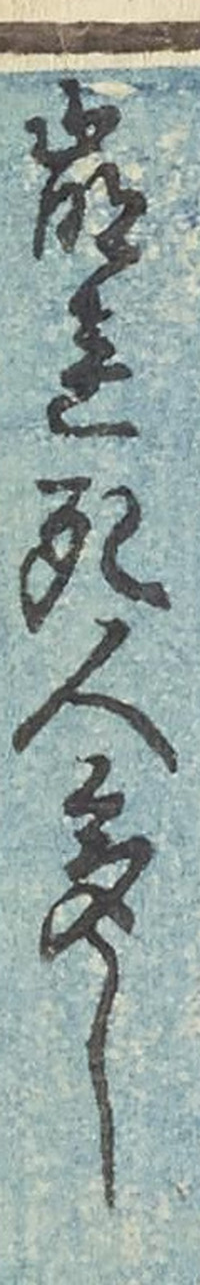崩れ死人多し
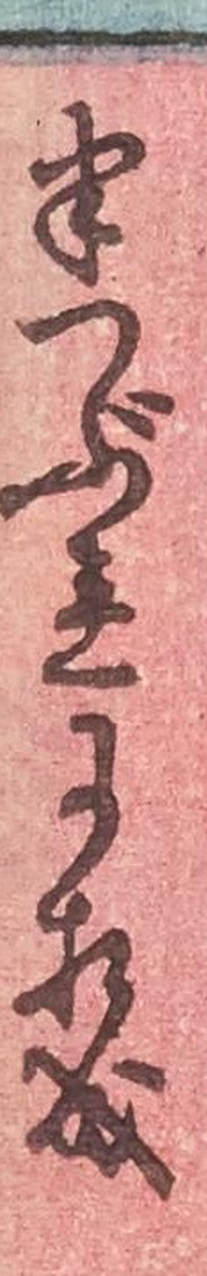半つぶれに相成

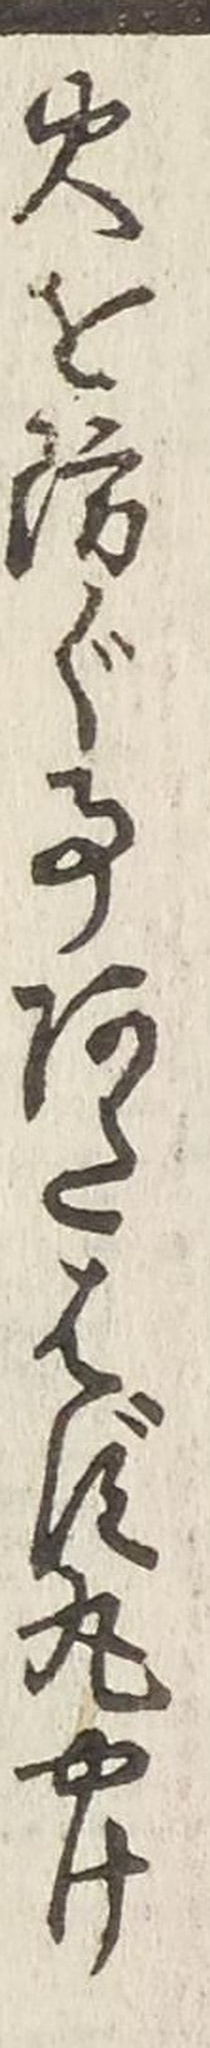火を防ぐ事あたはず丸やけ
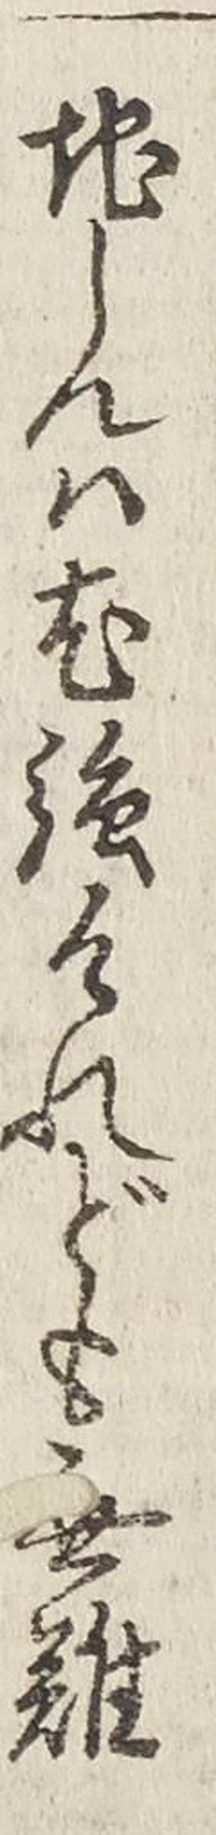地しんは尤強けれども無難
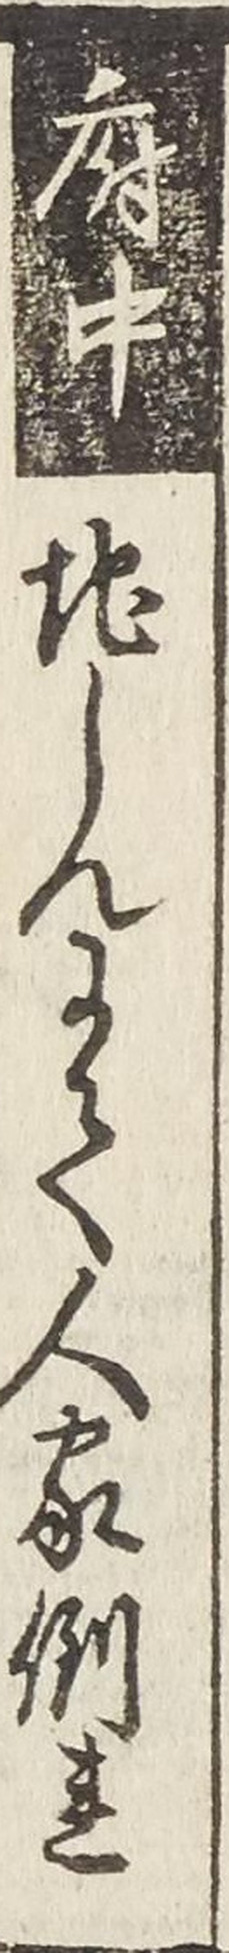府中地しんにて人家倒れ
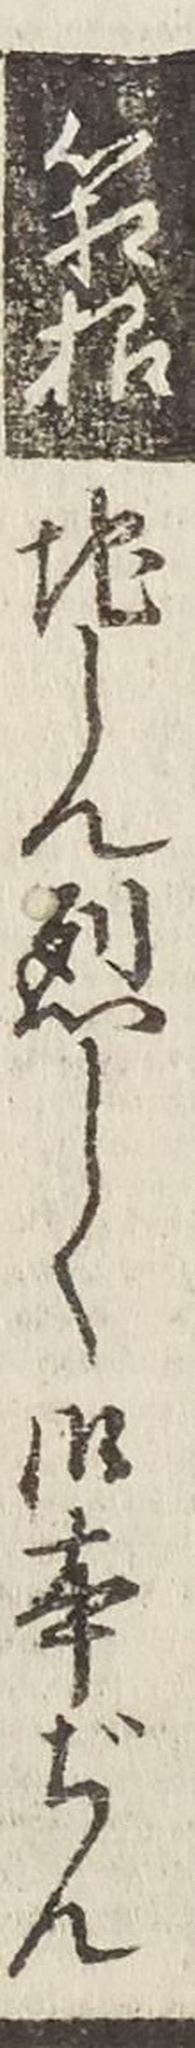箱根地しん烈しく御本ぢん
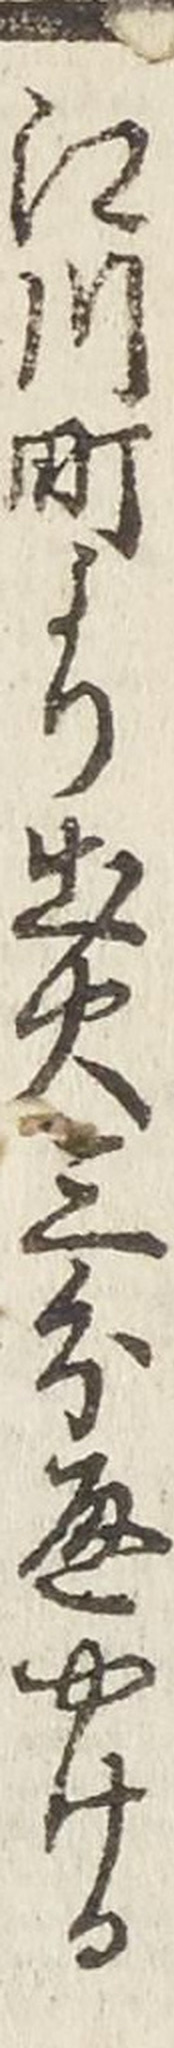江川町より出火三分通やける
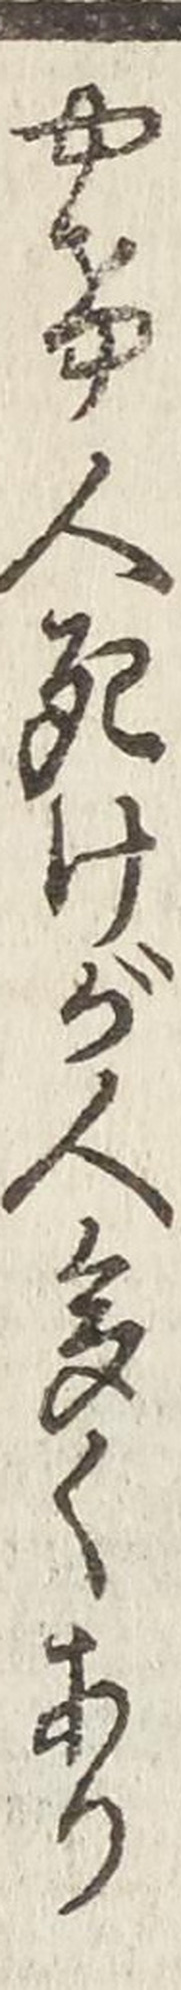やけ人死けが人多くあり
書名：大地震大津浪末代噺種　（二編　全）
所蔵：東京大学地震研究所図書室 Earthquake Research Institute Library, The University of Tokyo, JAPAN
